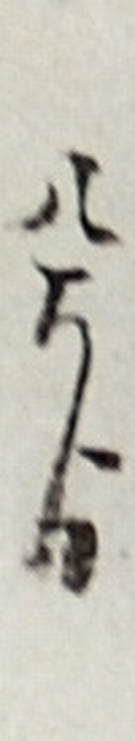治右衛門
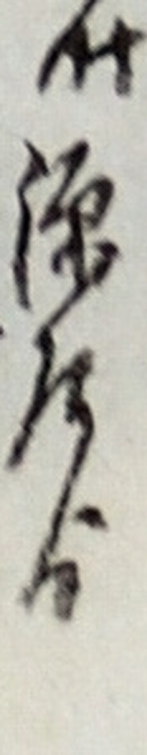小左衛門
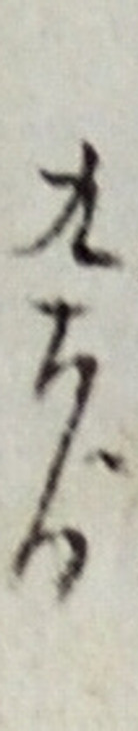九右衛門
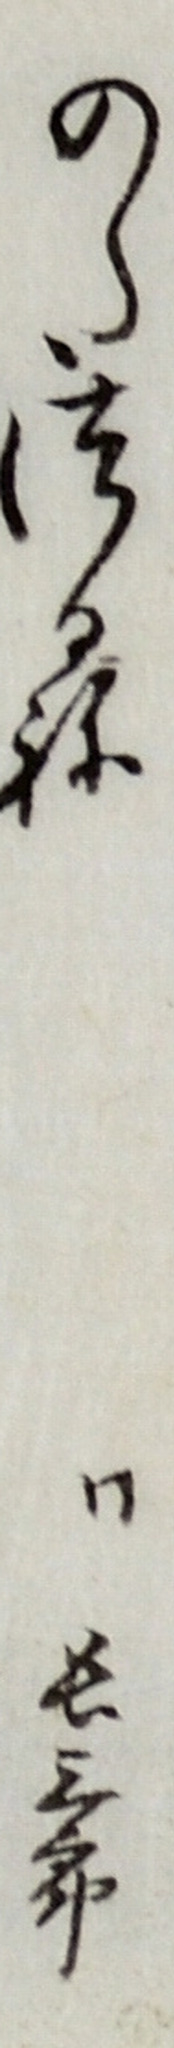のたつるね同長三郎
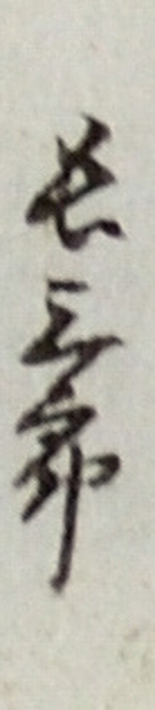長三郎
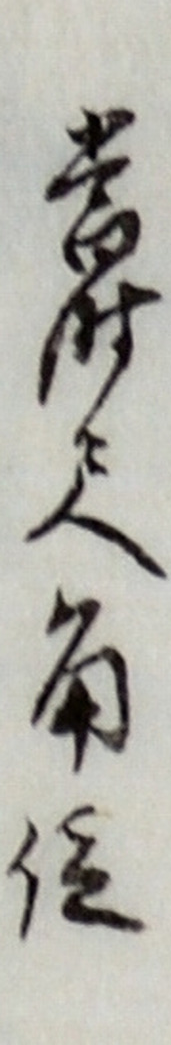当時尺角位
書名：郷中御林御竹薮名所附守之名前帳
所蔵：伊那市立高遠町図書館・合同会社AMANE
